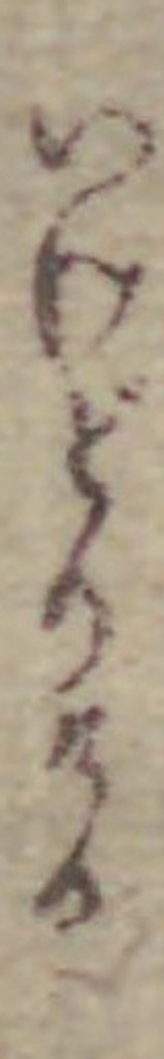いけどりける
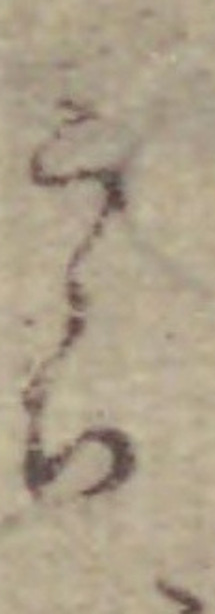こゝち
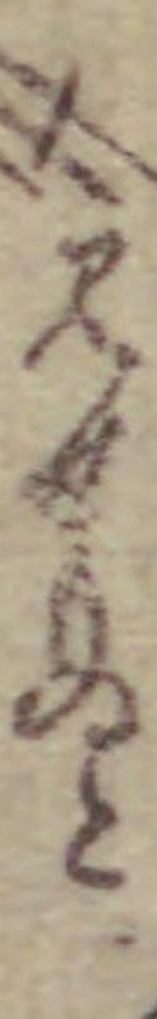みせものと
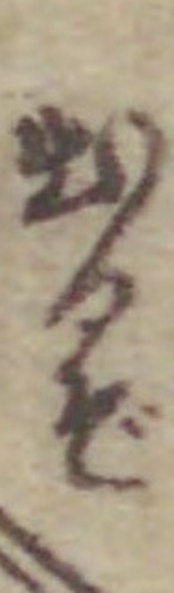出るぞ

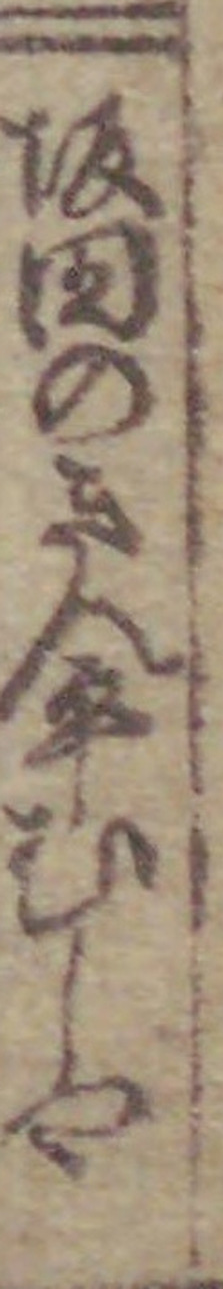坂田のきん平むしや
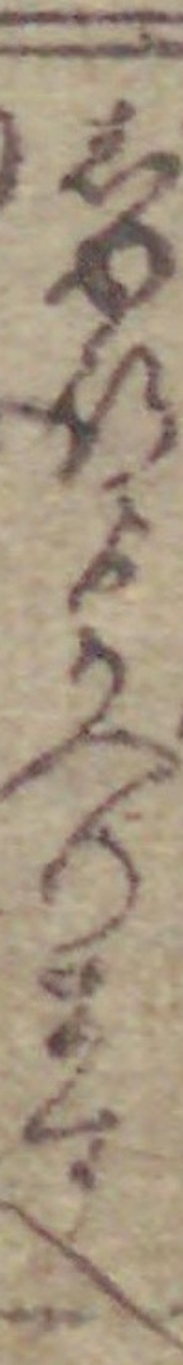しゆ行ゟかへります
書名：妖怪雪濃段 2巻
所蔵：国立国会図書館 National Diet Library, JAPAN
